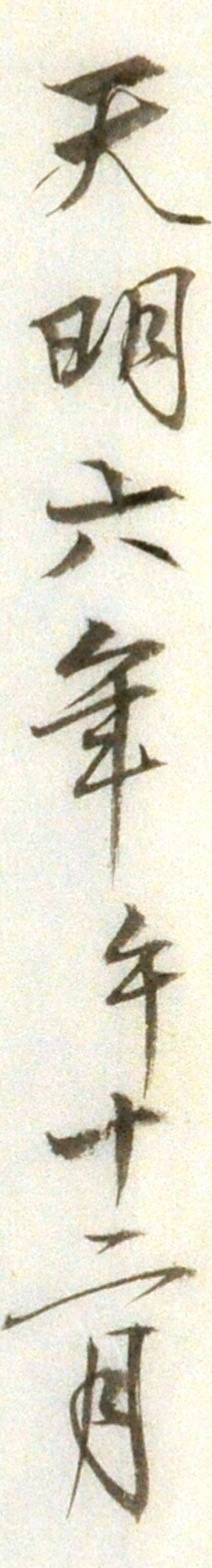天明六年午十二月
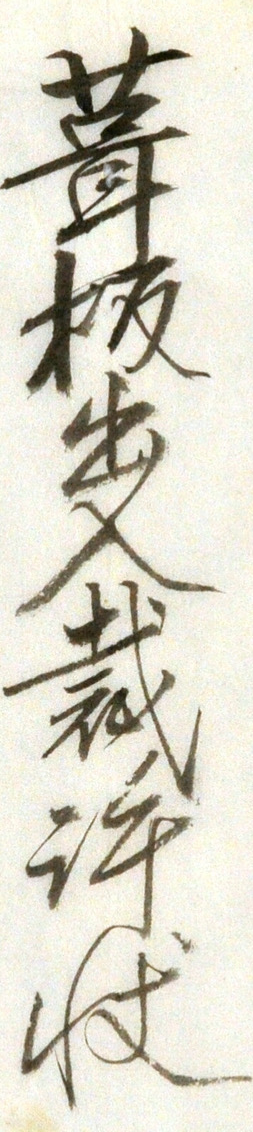葺板出入裁許状
